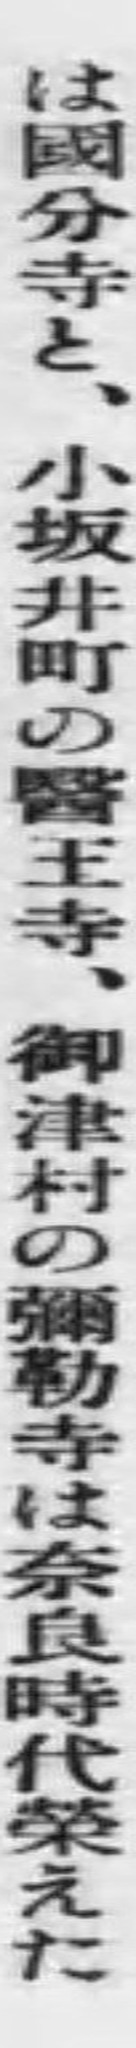は国分寺と、小坂井町の医王寺、御津村の弥勒寺は奈良時代栄えた
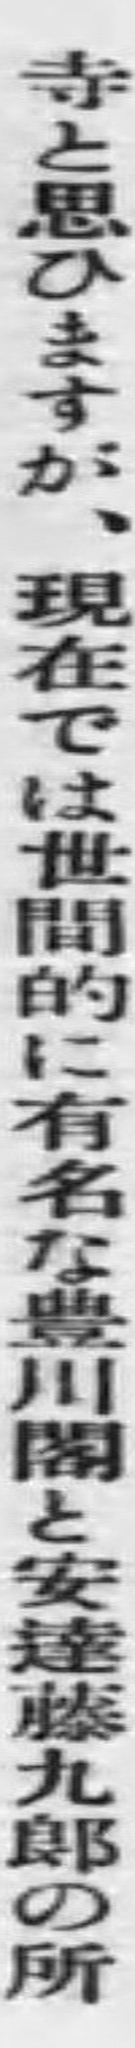寺と思ひますが、現在では世間的に有名な豊川閣と安達藤九郎の所
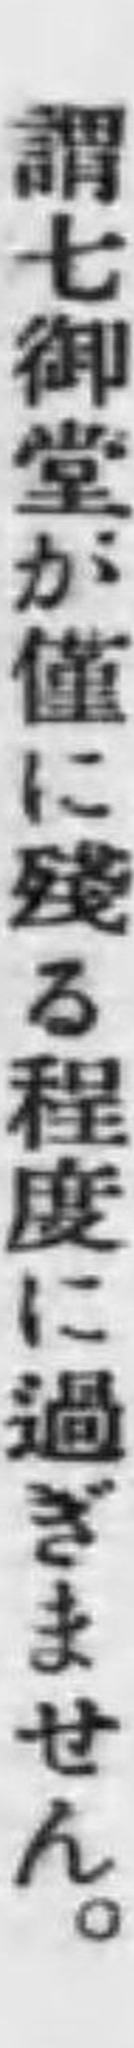謂七御堂が僅に残る程度に過ぎません。
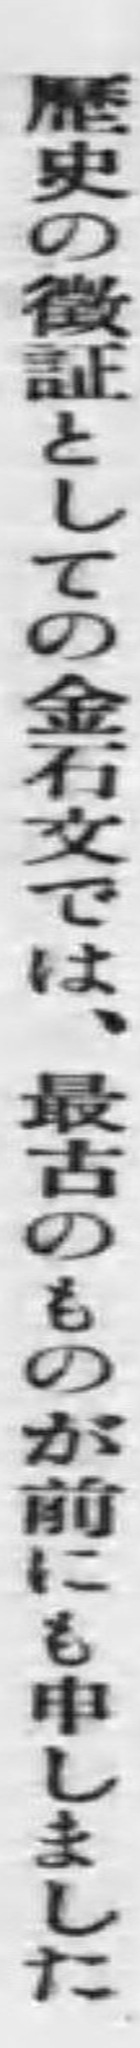歴史の徴証としての金石文では、最古のものが前にも申しました
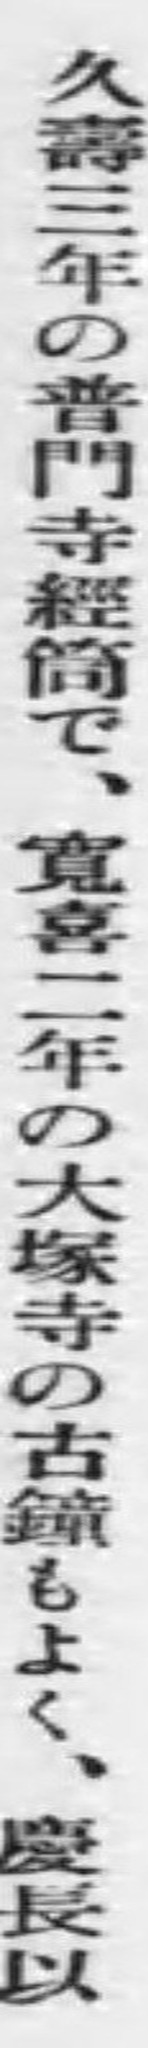久寿三年の普門寺経筒で、寛喜二年の大塚寺の古鐘もよく、慶長以
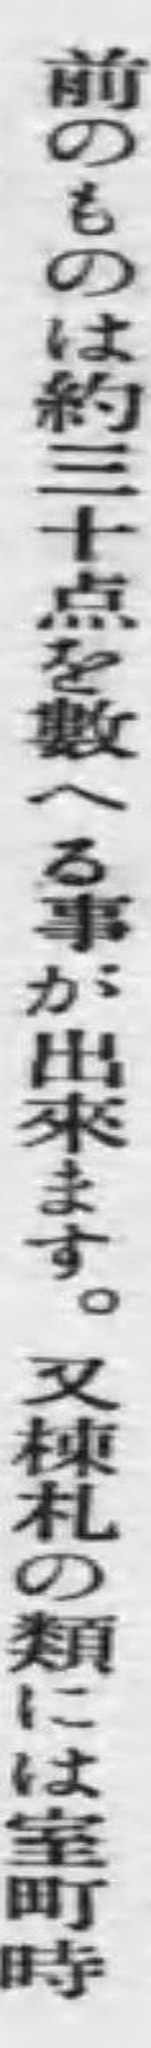前のものは約三十点を数へる事が出来ます。又棟札の類には室町時
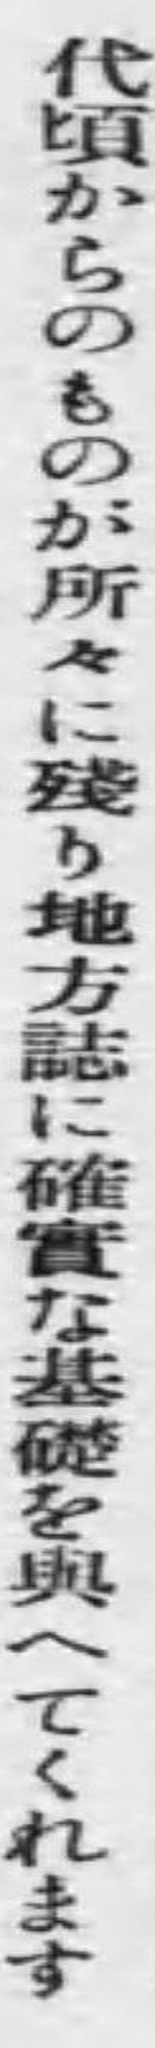代頃からのものが所々に残り地方誌に確実な基礎を与へてくれます
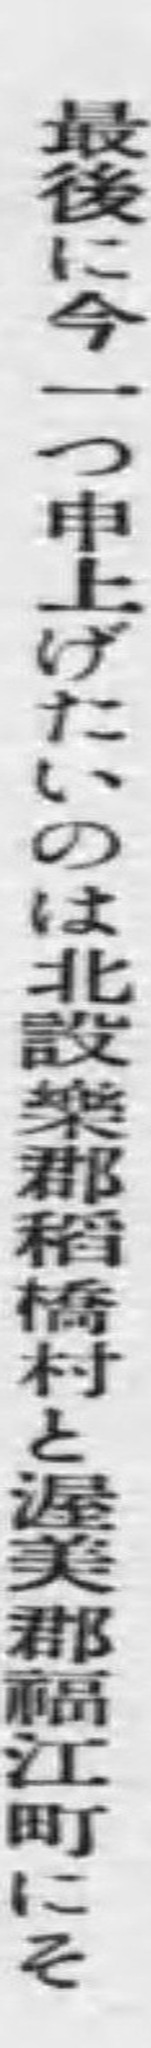最後に今一つ申上げたいのは北設楽郡稲橋村と渥美郡福江町にそ
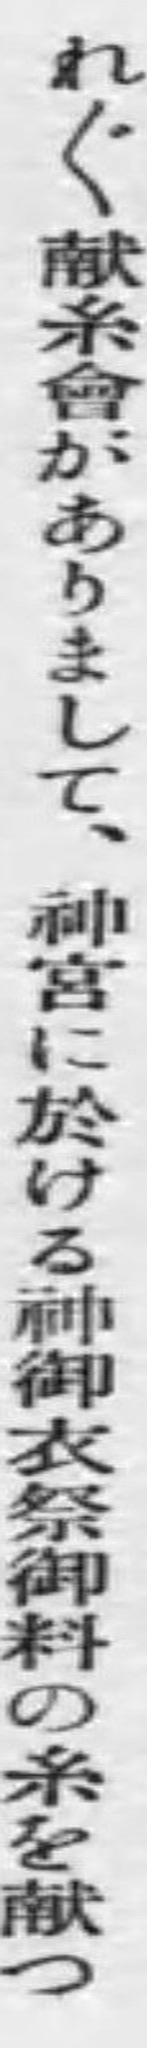れ〴〵献糸会がありまして、神宮に於ける神御衣祭御料の糸を献つ
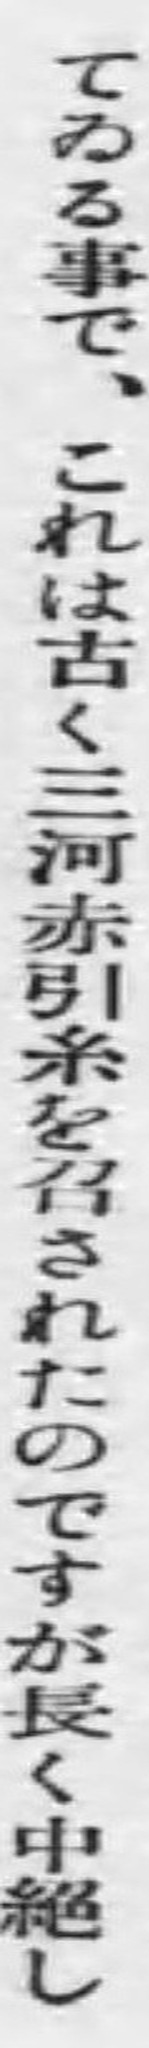てゐる事で、これは古く三河赤引糸を召されたのですが長く中絶し
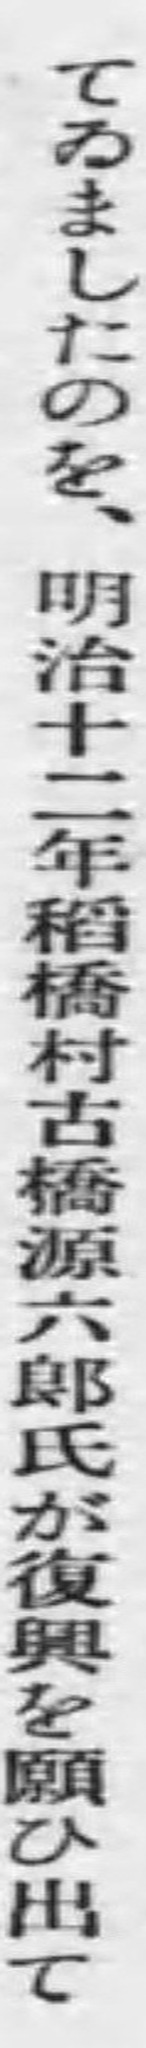てゐましたのを、明治十二年稲橋村古橋源六郎氏が復興を願ひ出て
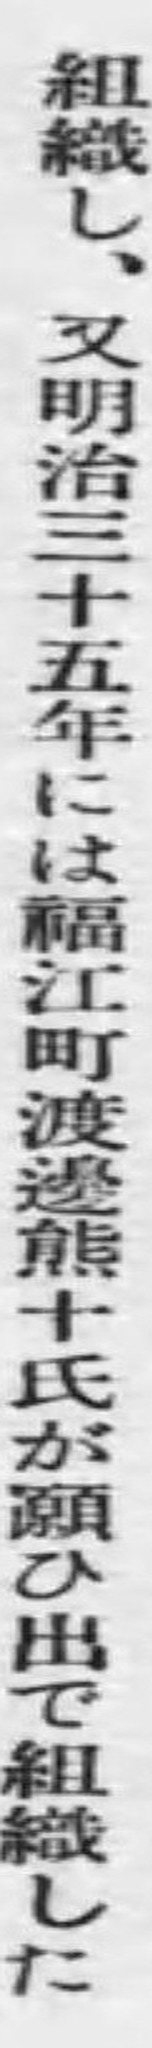組織し、又明治三十五年には福江町渡辺熊十氏が願ひ出で組織した
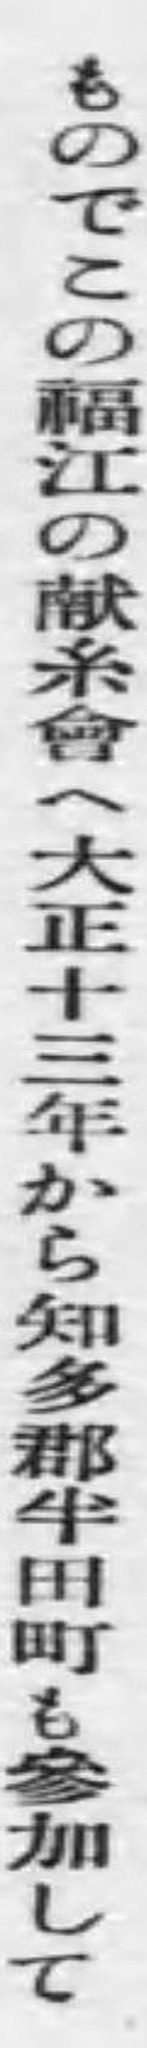ものでこの福江の献糸会へ大正十三年から知多郡半田町も参加して
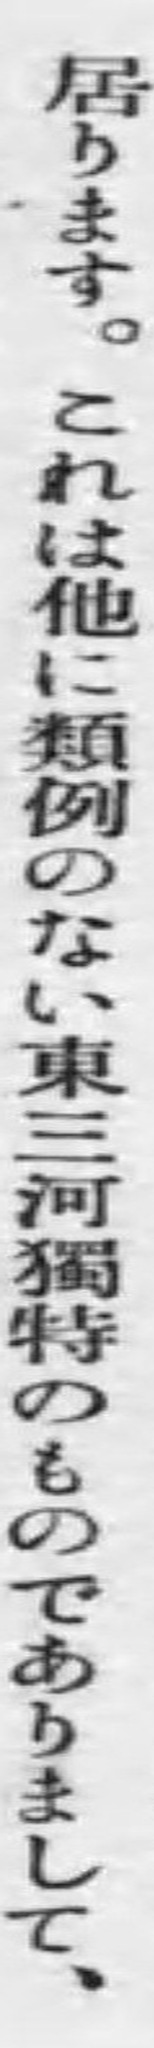居ります。これは他に類例のない東三河独特のものでありまして、
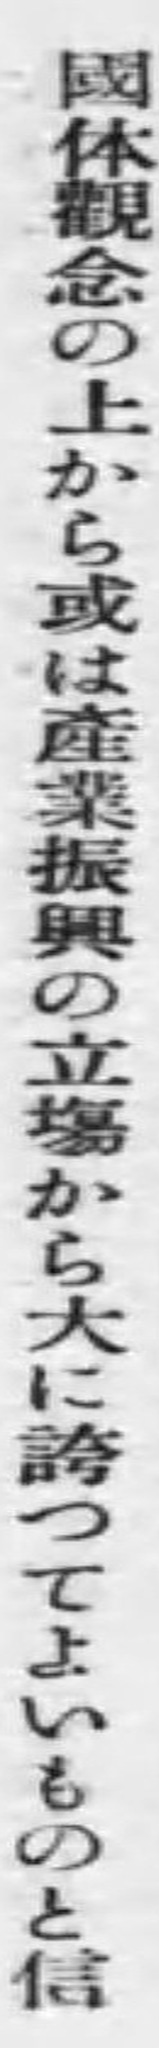国体観念の上から或は産業振興の立場から大に誇つてよいものと信
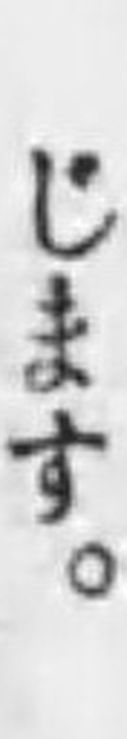じます。
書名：東三河道中記 : 豊橋市及其附近案内
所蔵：国立国会図書館 National Diet Library, JAPAN
